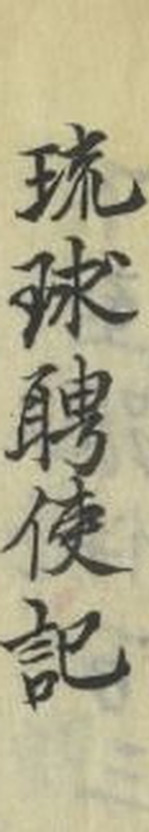琉球聘使記
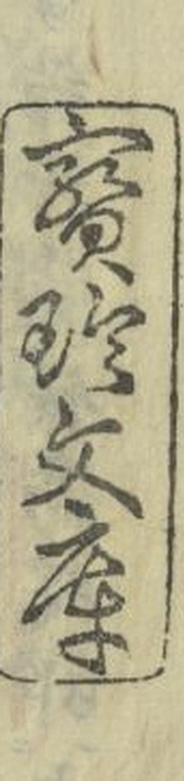宝玲文庫
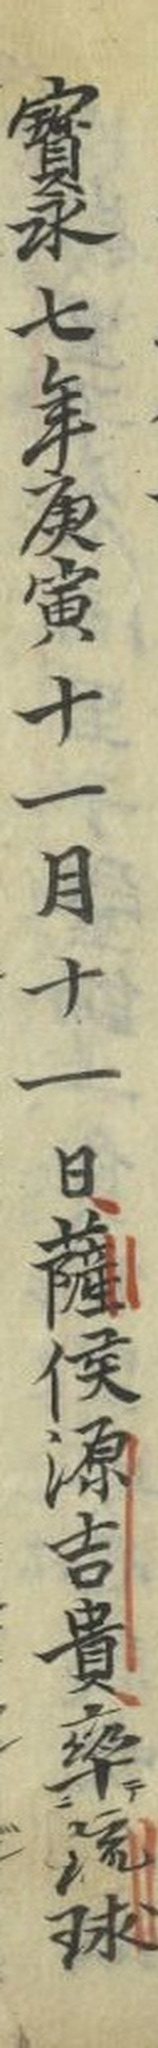宝永七年庚寅十一月十一日薩侯源吉貴卒琉球
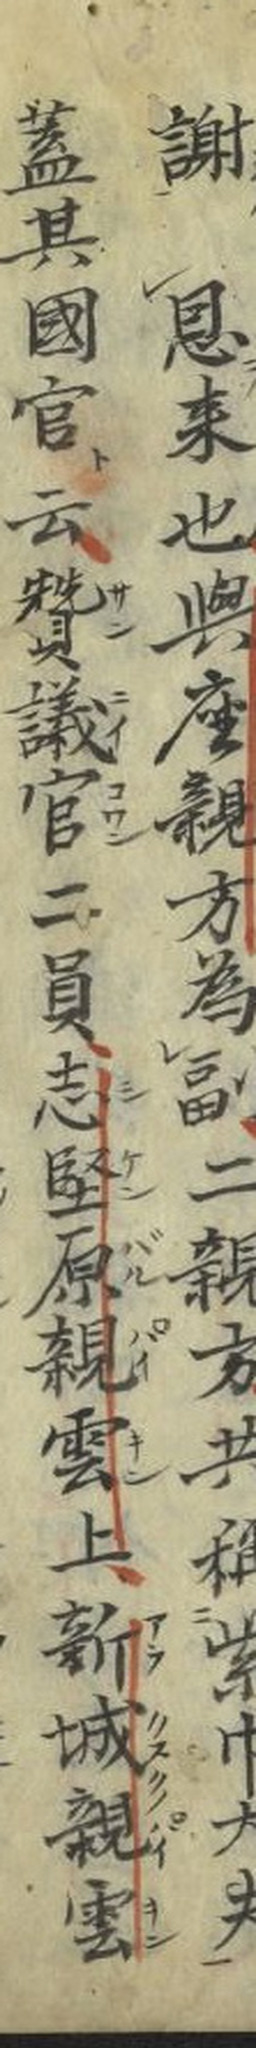蓋其国官云賛議官ニ員志堅原親雲上新城親雲
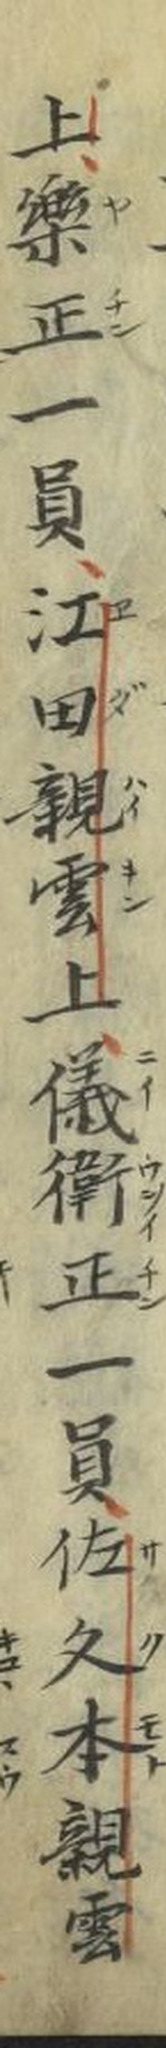上楽正一員江田親雲上儀衛正一員佐久本親雲
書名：琉球聘使記
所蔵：University of the Ryukyus Library
